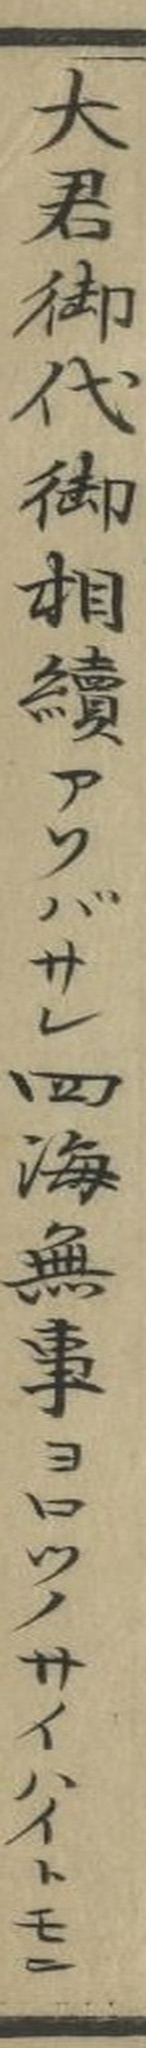大君御代御相続アソバサレ四海無事ヨロツノサイハイトモニ

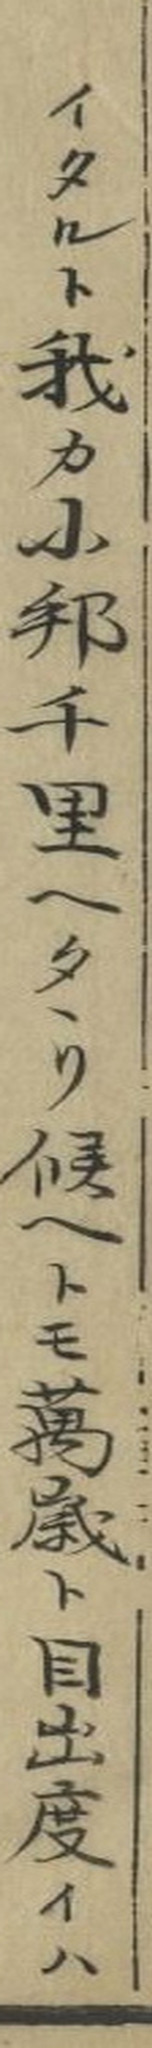イタルト我カ小邦千里ヘタヽリ候トモ万歳ト目出度イハ
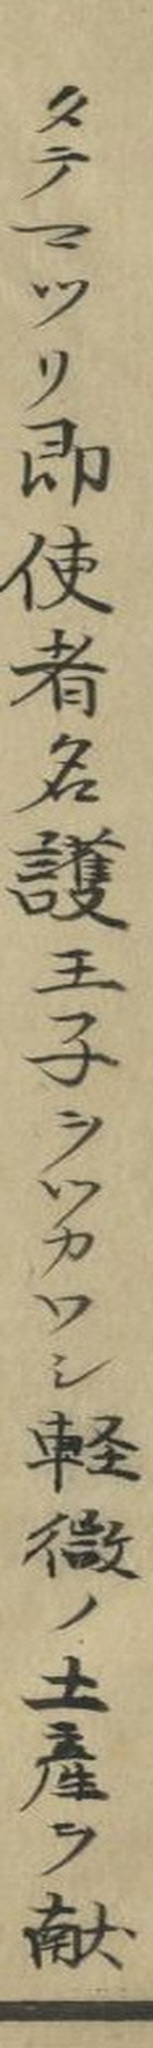タテマツリ即使者名護王子ヲツカワシ軽微ノ土産ヲ献
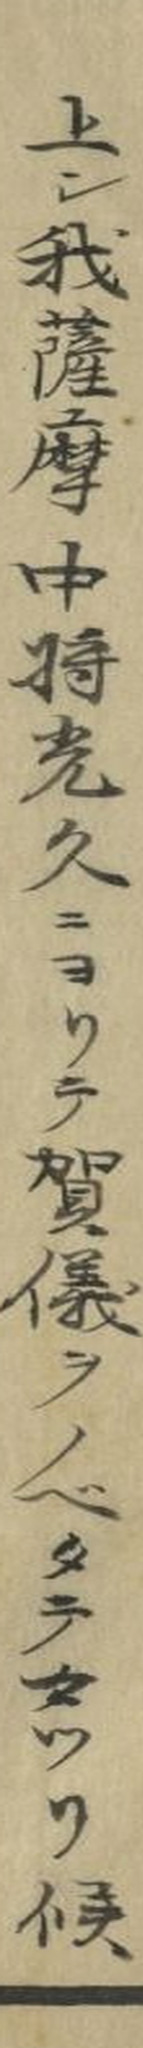上シ我薩摩中将光久二ヨリテ賀儀ヲノベタテマツリ候
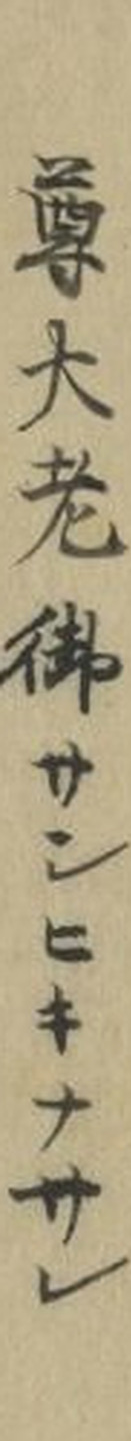尊大老御サシヒキナサレ
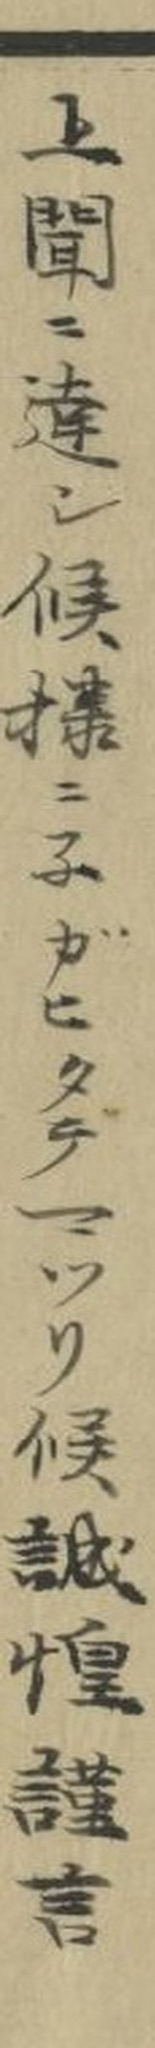上聞二達シ候様二ネガヒタテマツリ候誠惶謹言
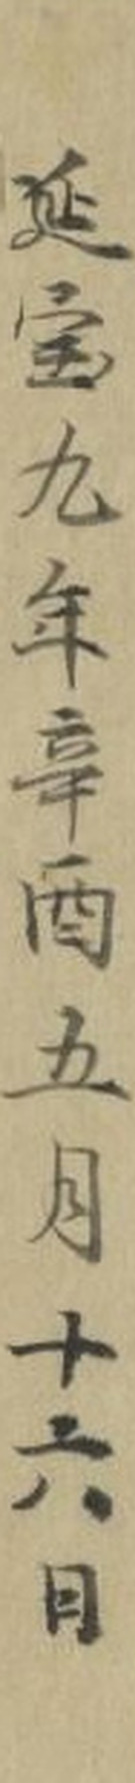延宝九年辛酉五月十六日
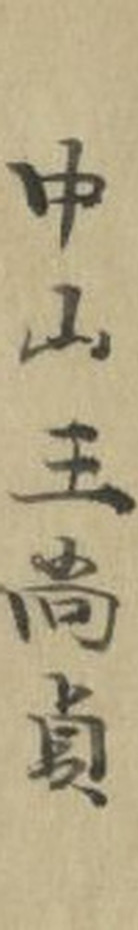中山王尚貞
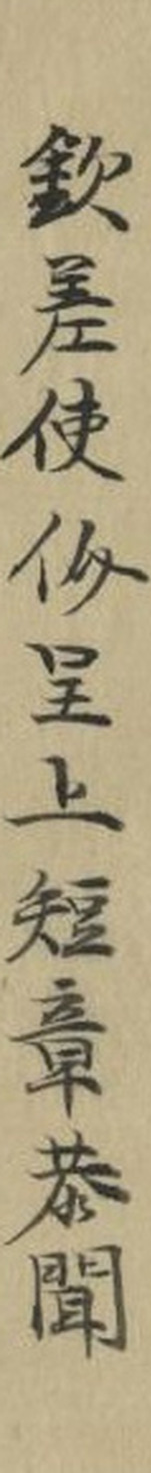欽差使价呈上短章恭聞
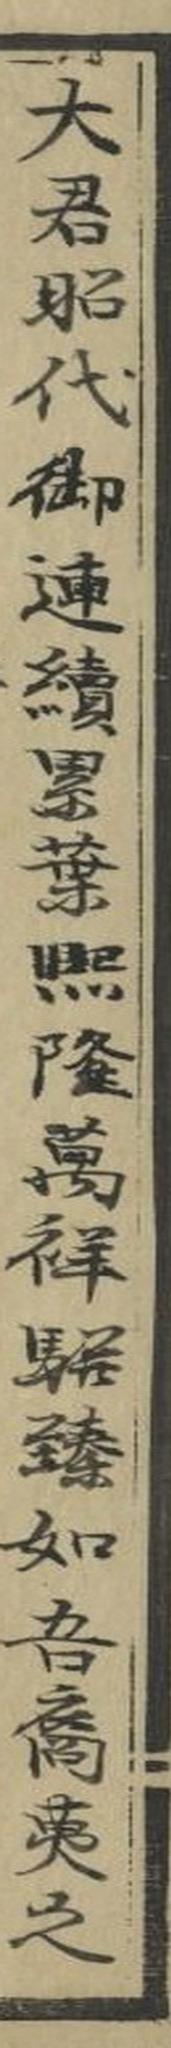大君昭代御連続累葉興隆万祥駢臻如吾裔夷之
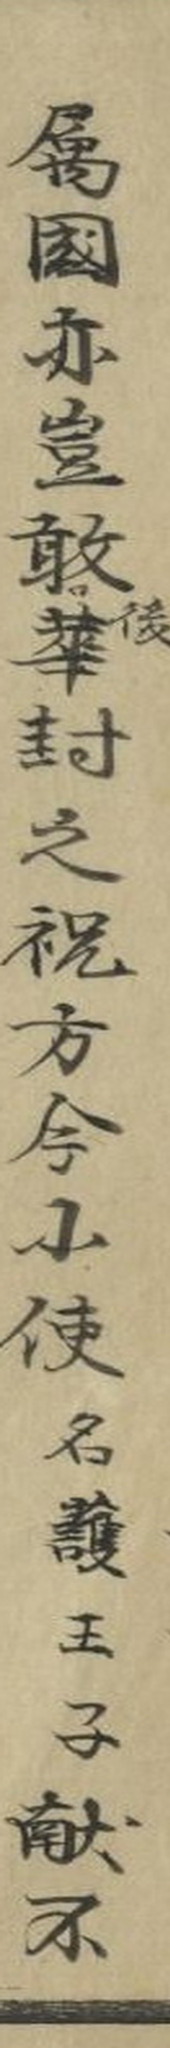属国亦豈敢後華之祝方今小使名護王子献不
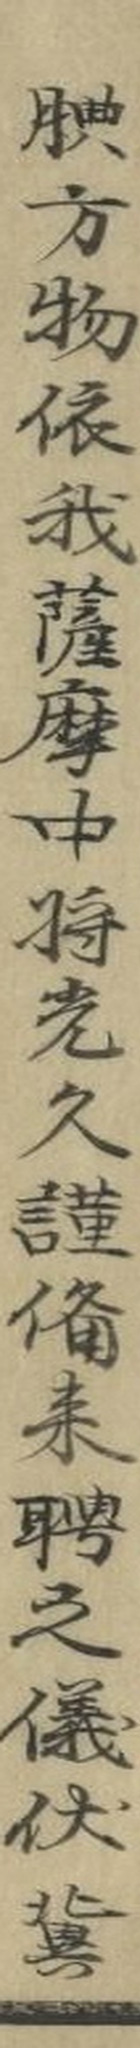腆方物依我薩摩中将光久謹備来聘之儀伏冀
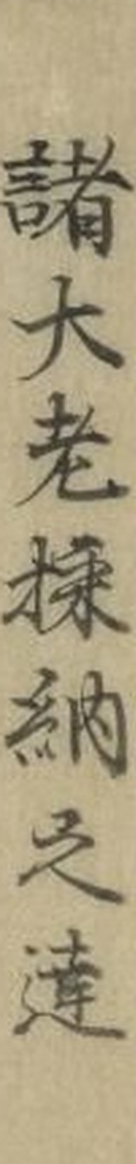諸大老様納之達
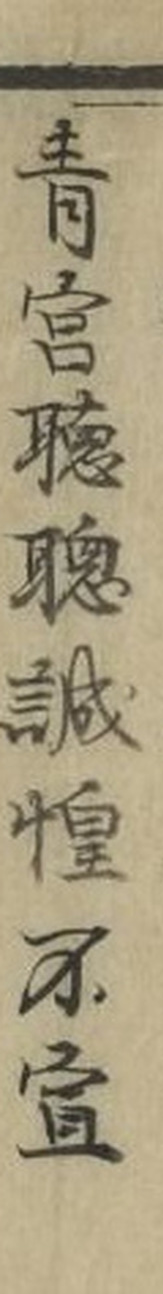青宮聴聭誠惶不宣
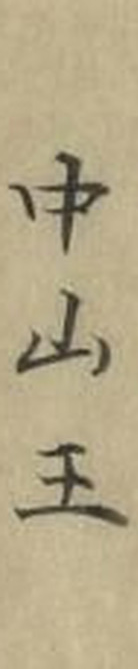中山王
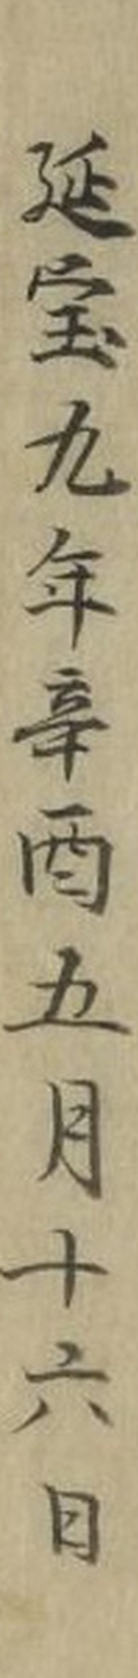延宝九年辛酉五月十六日
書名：琉球往来（下）
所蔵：University of the Ryukyus Library
